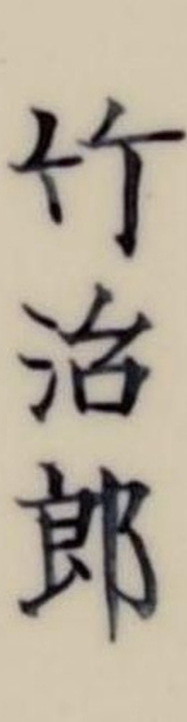竹治郎
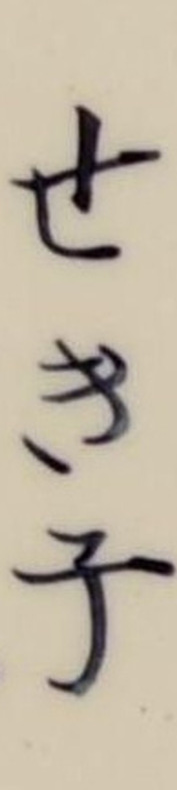せき子
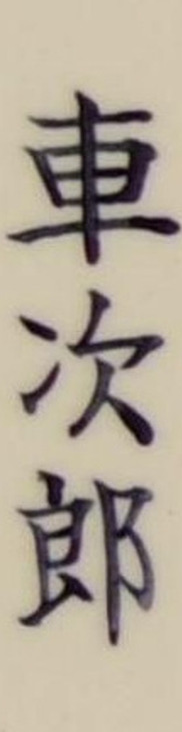車次郎
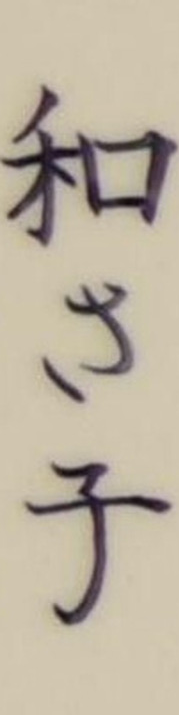和さ子

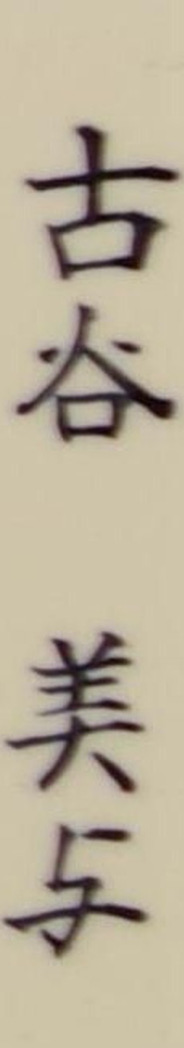古谷美与
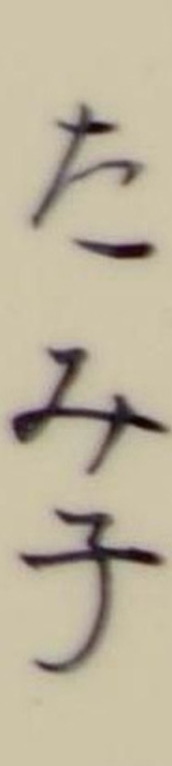たみ子
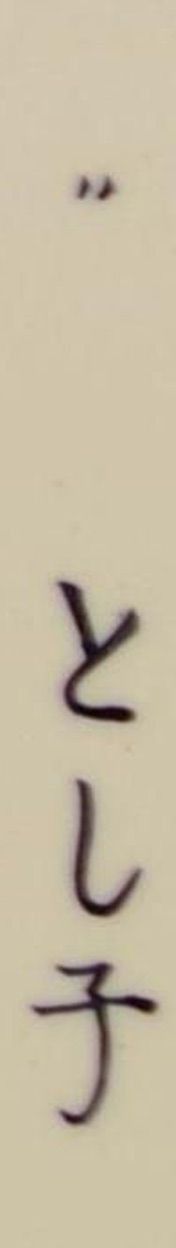とし子
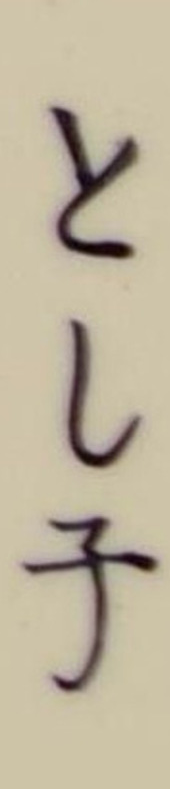とし子
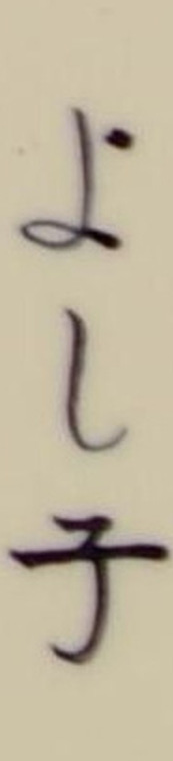よし子
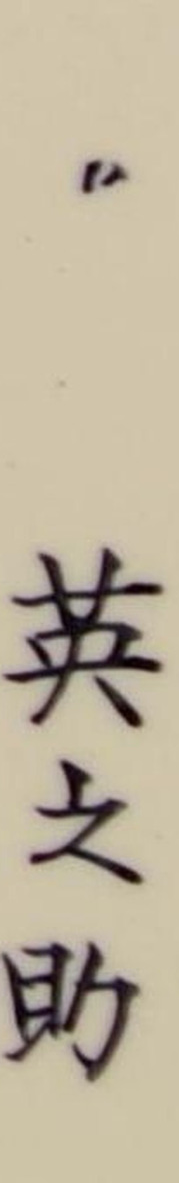英之助
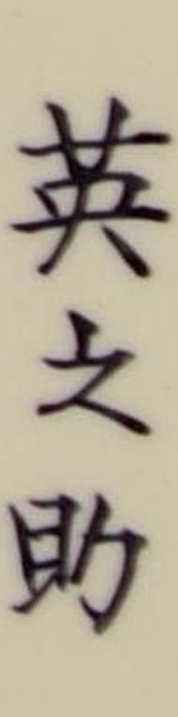英之助
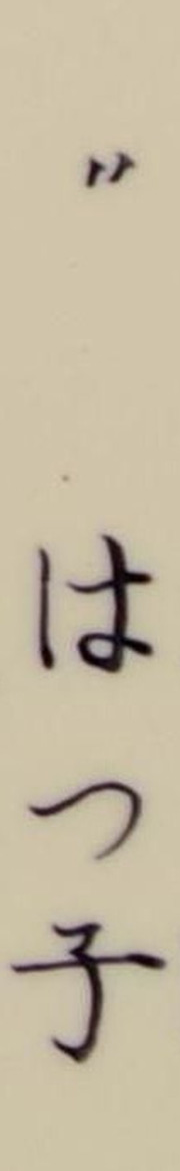はつ子
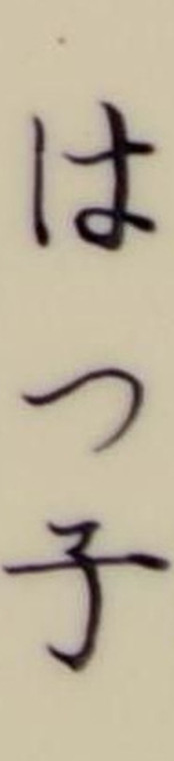はつ子
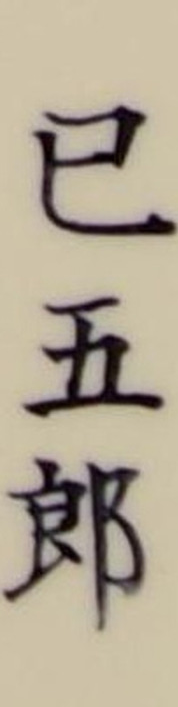巳五郎
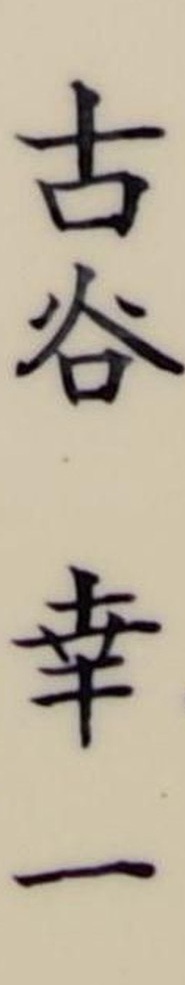古谷幸一
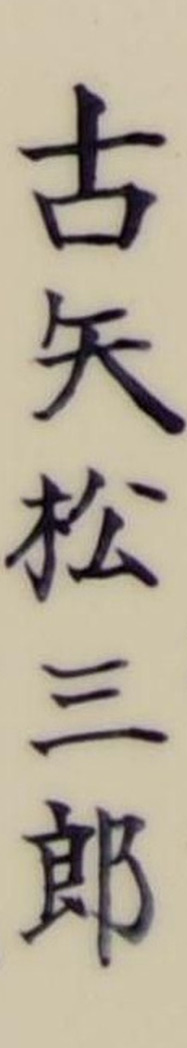古矢松三郎
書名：E~L
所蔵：高野山金剛峯寺
